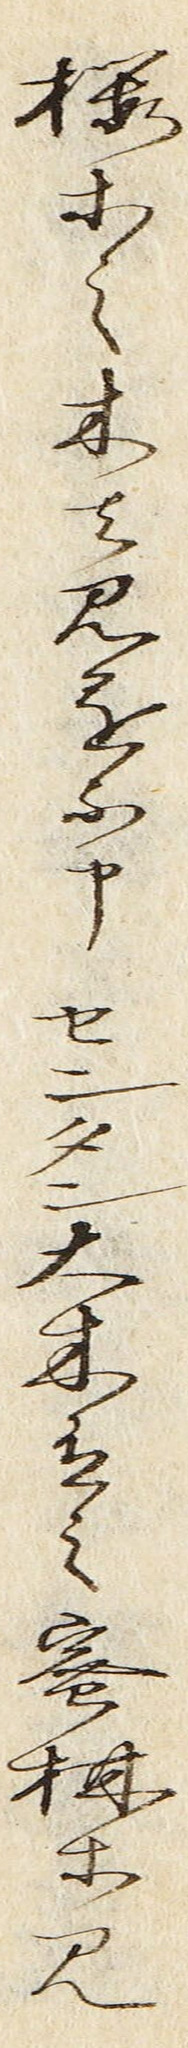桜等之木は見懸不申センタン大木有之蜜林等見
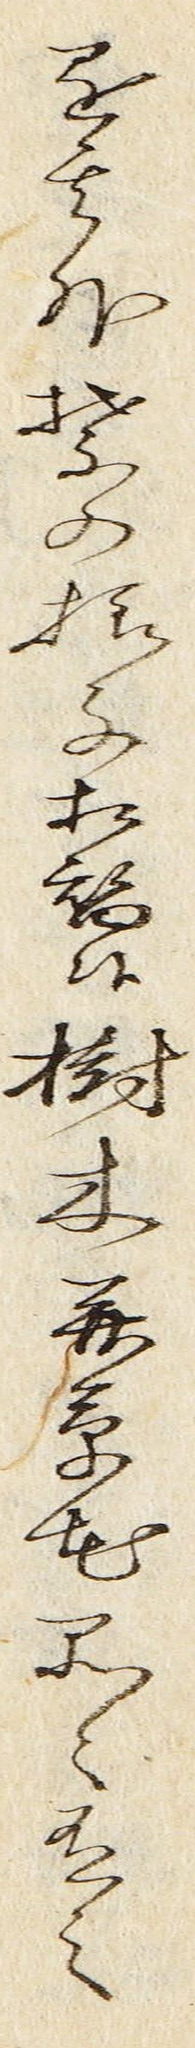懸其外葉の様子相替候樹木并草花品々有之
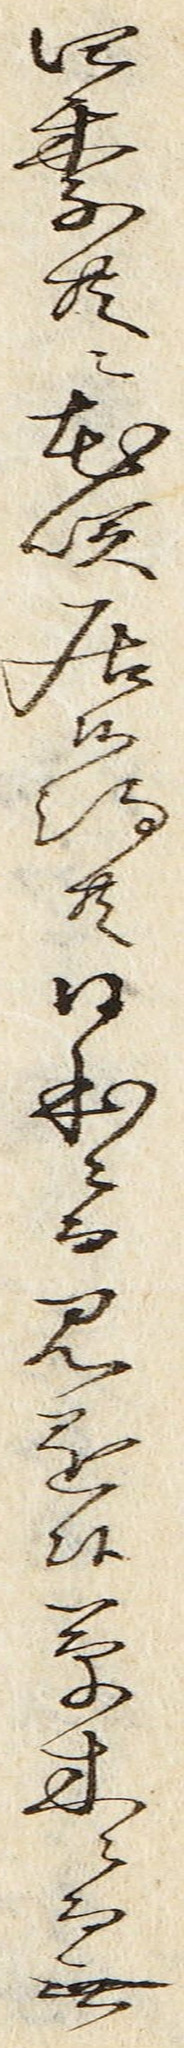四季共に花咲居候得共日本に而見懸候草木に而無
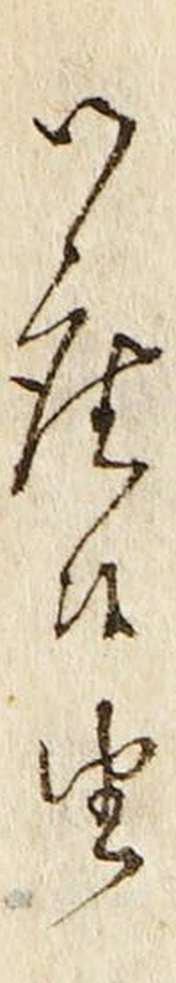御座候由
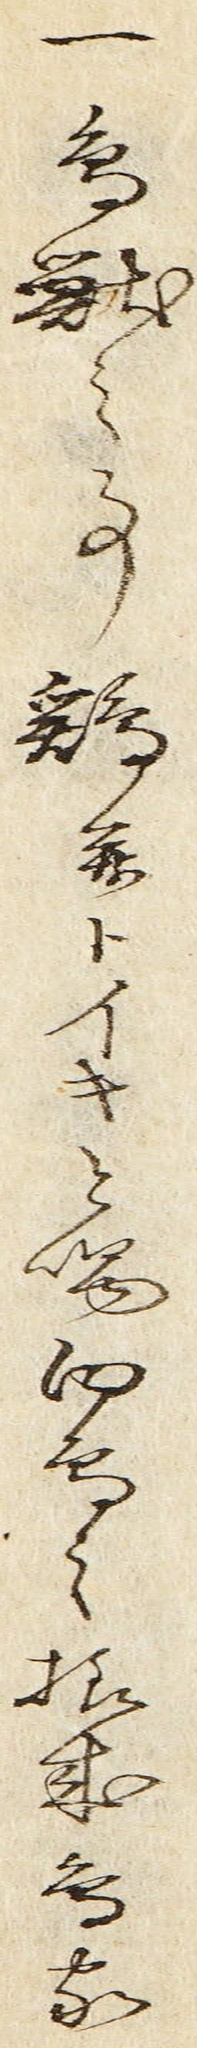一鳥獣之事鶏并トイキと唱白鳥之様成鳥家

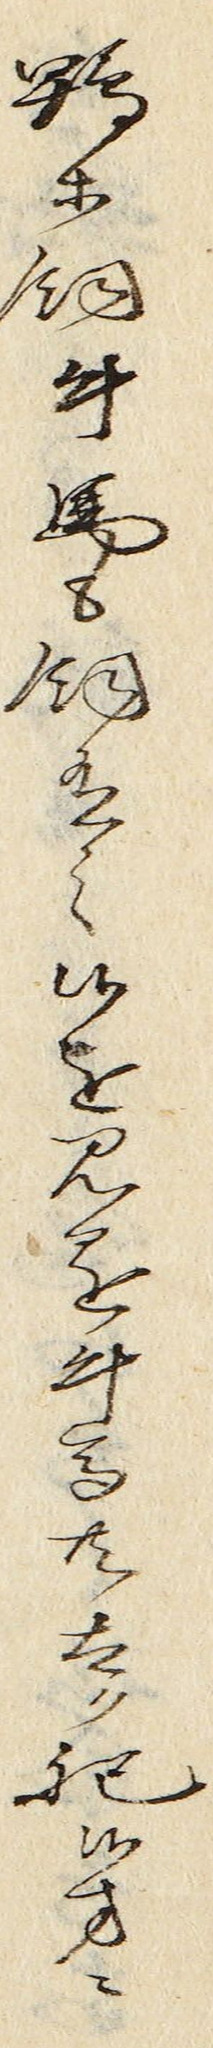鴨等飼牛馬も飼有之候を見懸牛馬共太く肥候方に
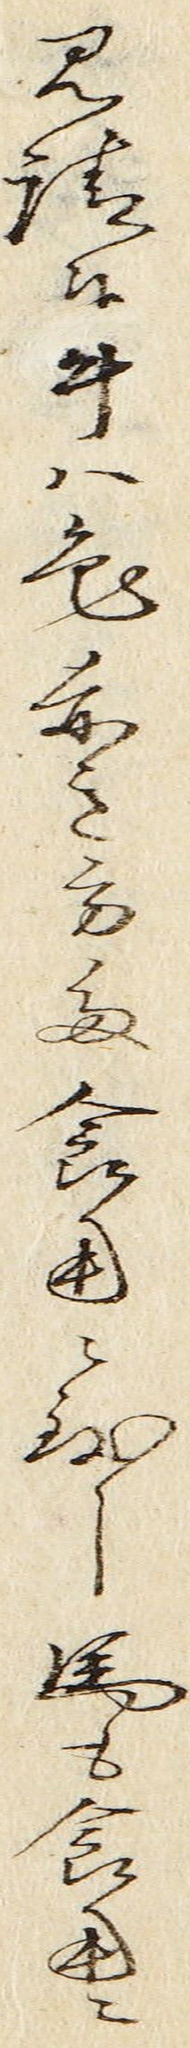見請候牛は色赤き方多食用に致し馬も食用に
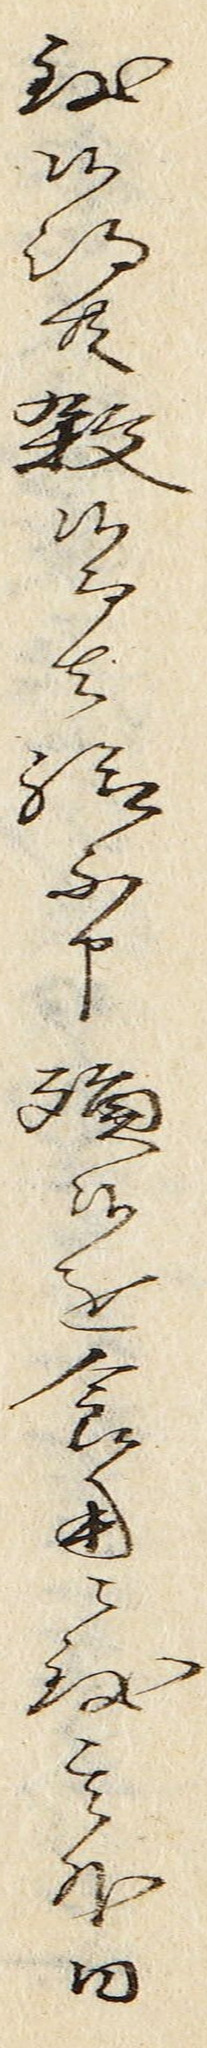致候得共殺候而は給不申殞候を食用に致其外日
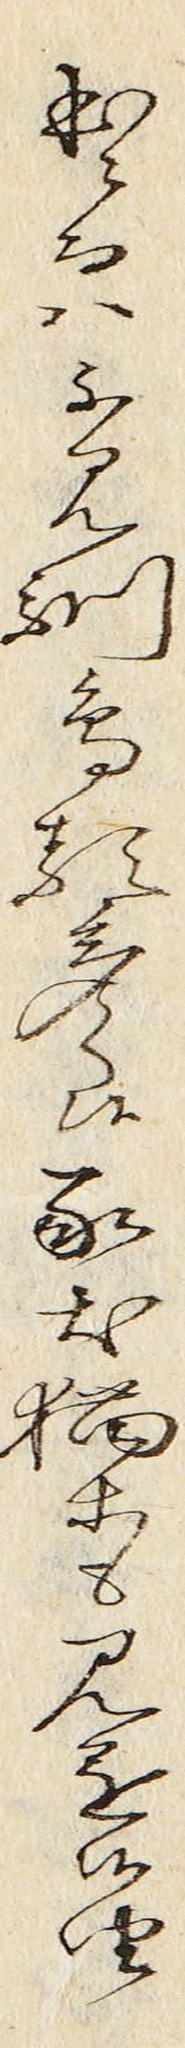本に而は不見馴鳥類多く候豕犬猫等も見懸候由
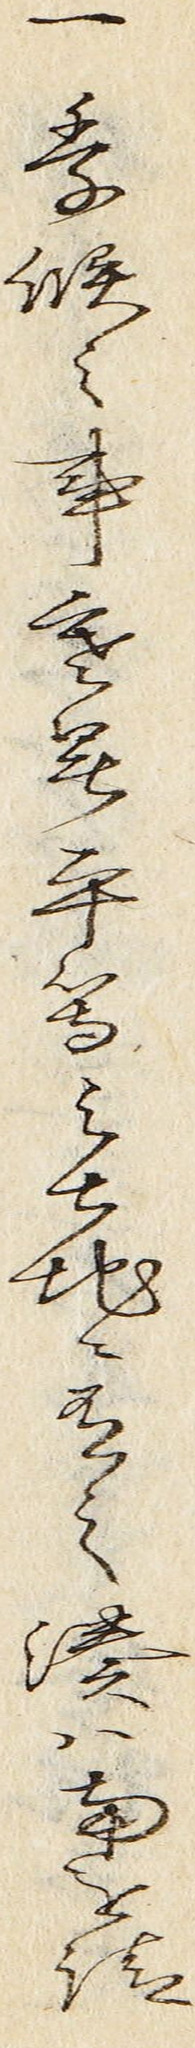一季候之事寒暑平等之土地に有之湊は南を請
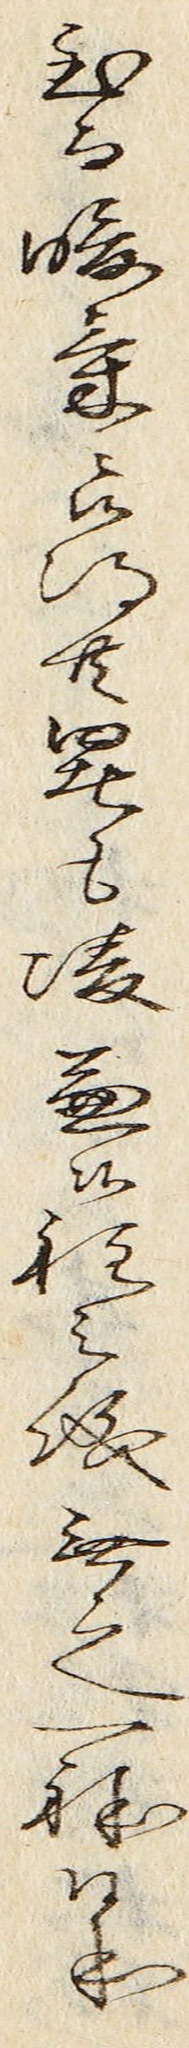至而暖気に候得共暑も凌兼候程之儀無之一躰日本
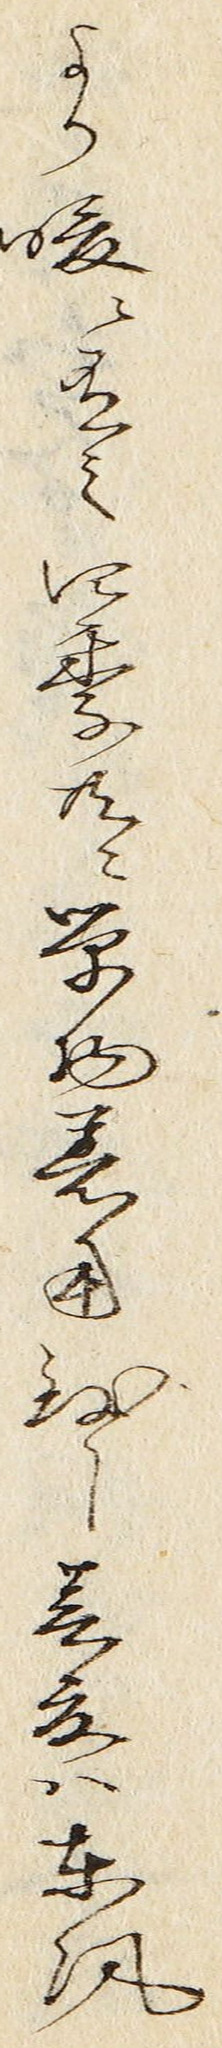より暖に有之四季共に単物着用致し春夏は東風
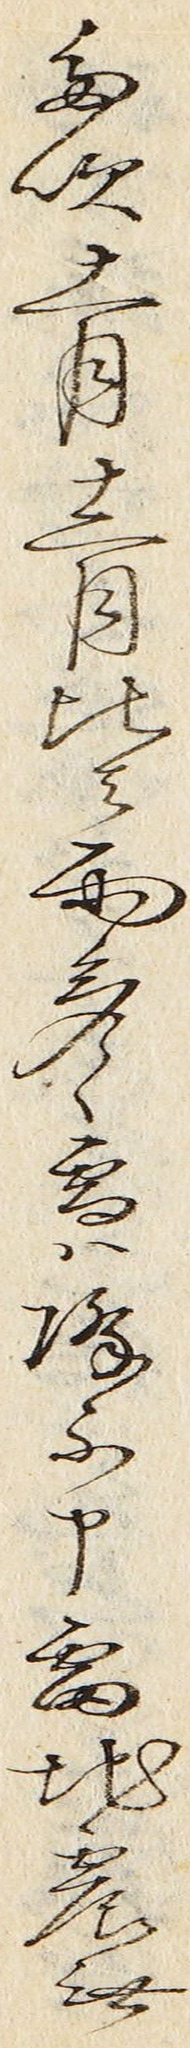多吹十一月十二月比は雨多く雪は降不申雷地震無
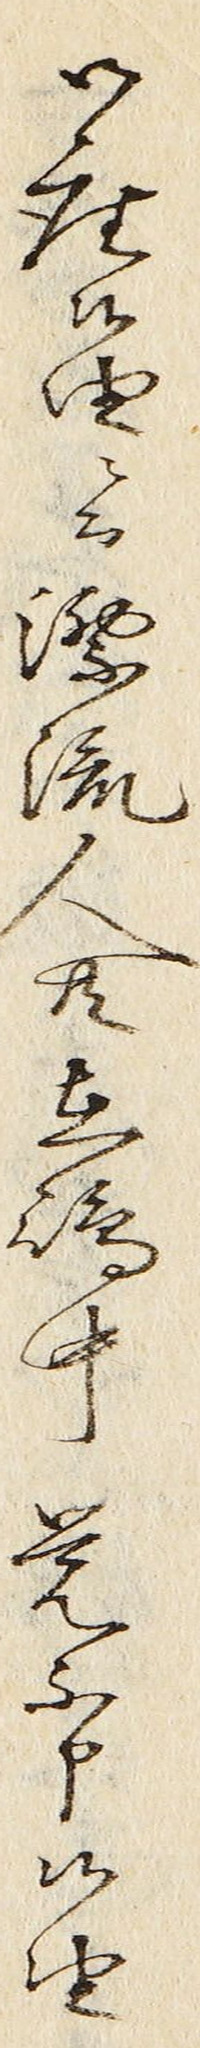御座候由に而漂流人共在嶋中覚不申候由
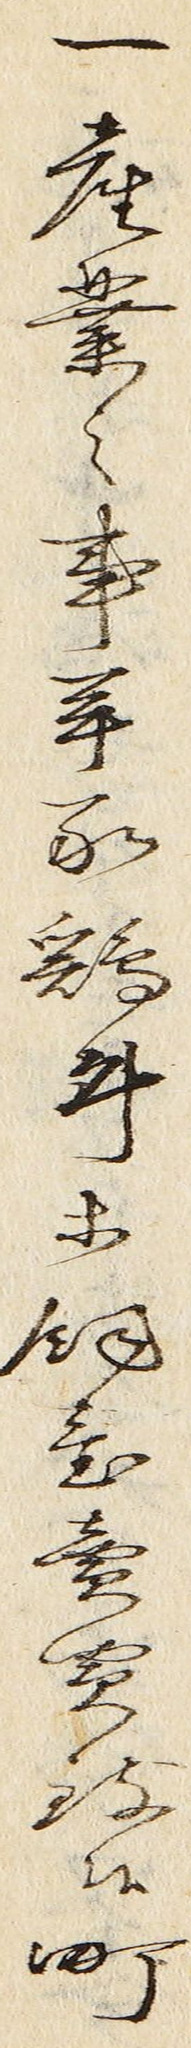一産業之事羊豕鶏牛等飼置売買致候町
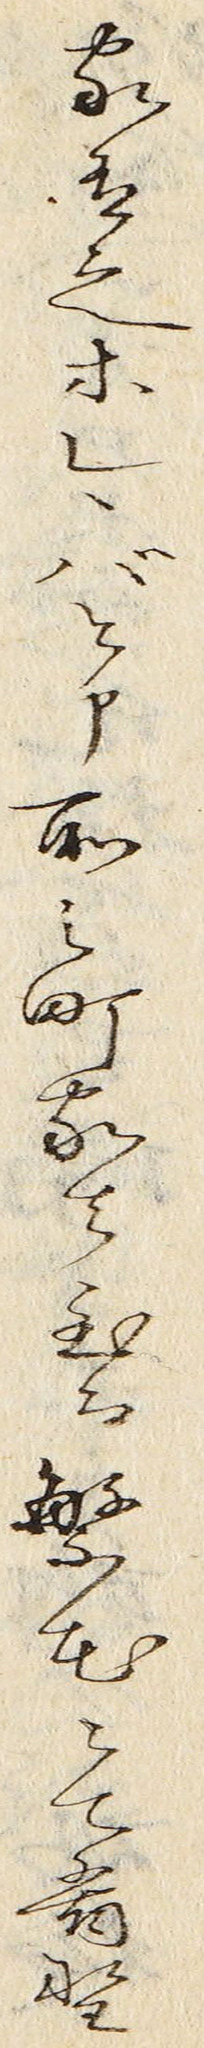家有之ホレヽバと申所之町家は至而繁花にて肴野
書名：土佐中浜万次郎漂流記
